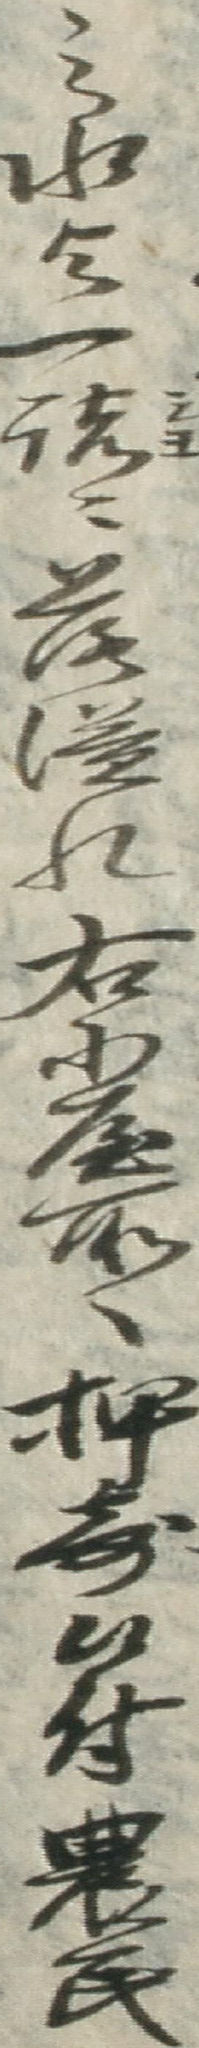之水と一諸二落溢れ右小屋所へ押寄候二付農民
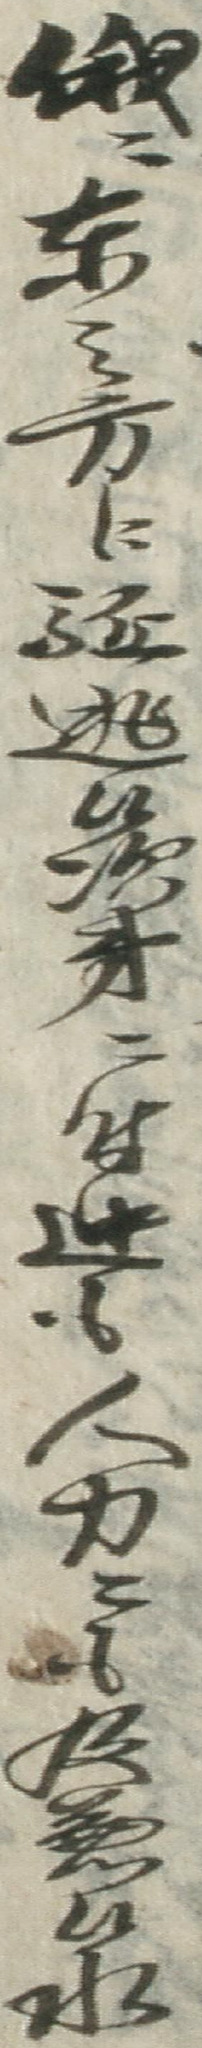俄二東之方江駈逃候次第二付迚も人力二も及兼候水
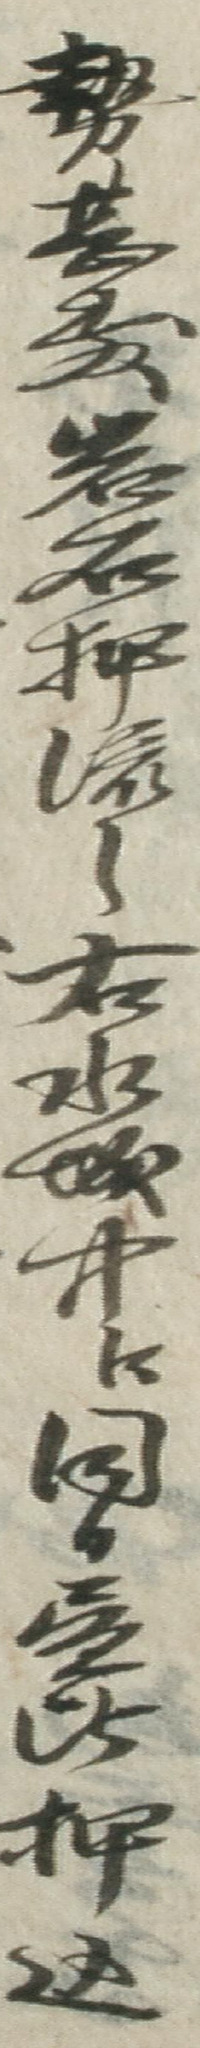勢甚敷岩石流し右水城中江同日昼比押込
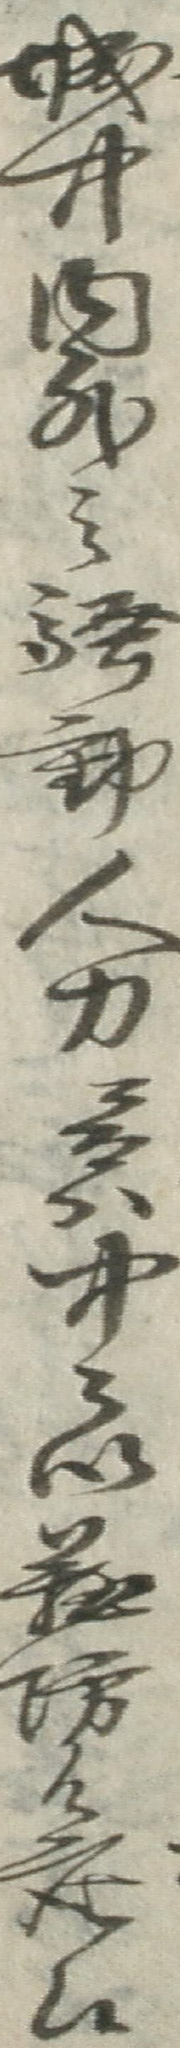城中内外之騒動人力二而ハ中々以難防御座候
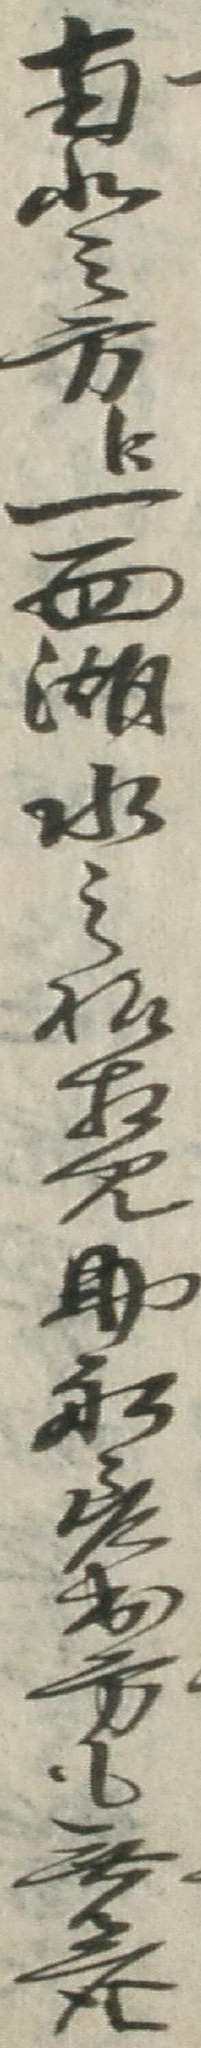南北之方江一面湖水之様相見助船差出方も無御座
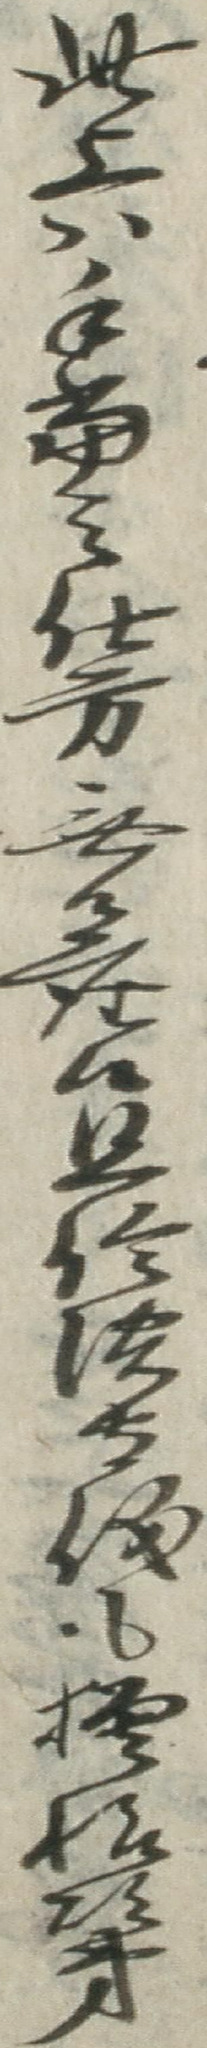此上ハ手当之仕方無御座候且信濃守儀も拘様次第
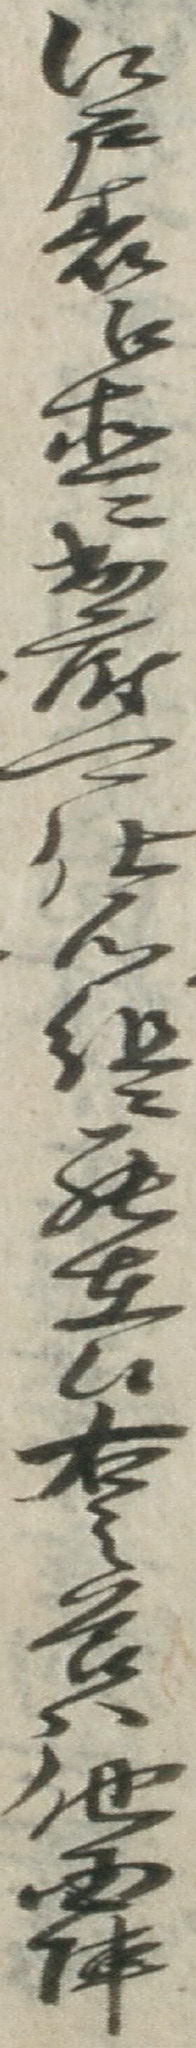江戸表江直二出府可仕心組二罷在候右之節ハ他国陣
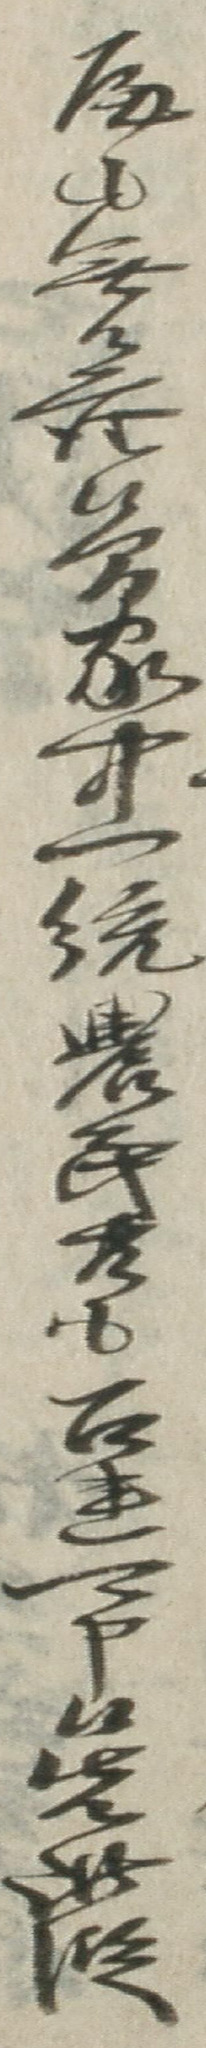屋も無御座候間家中一統農民共も召連可申候先此段
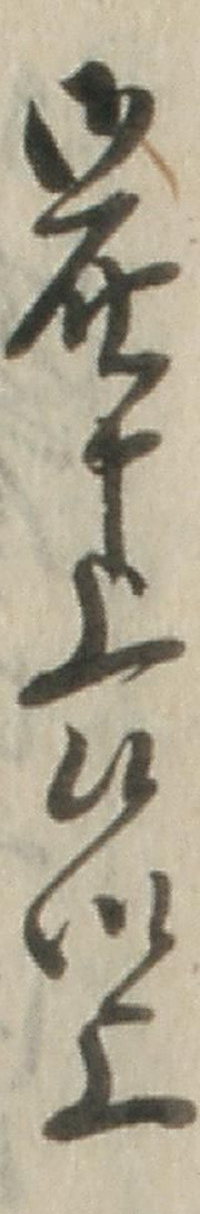御届申上候以上
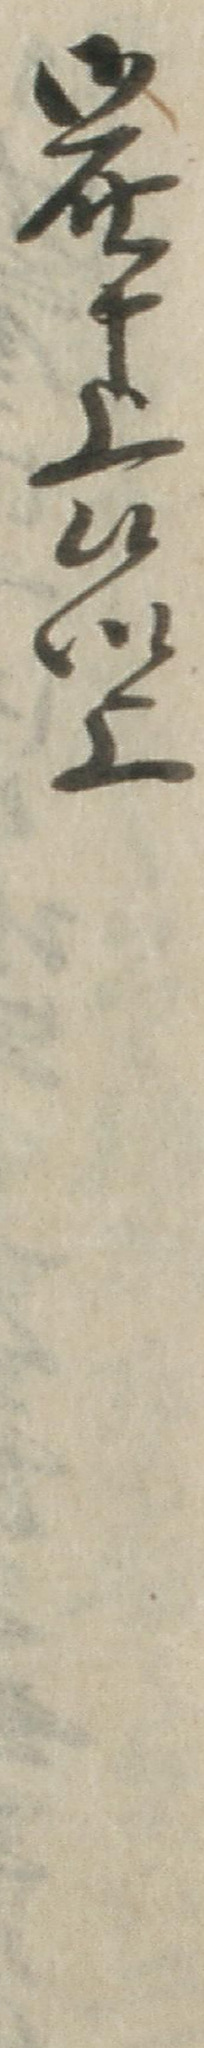御届申上候以上
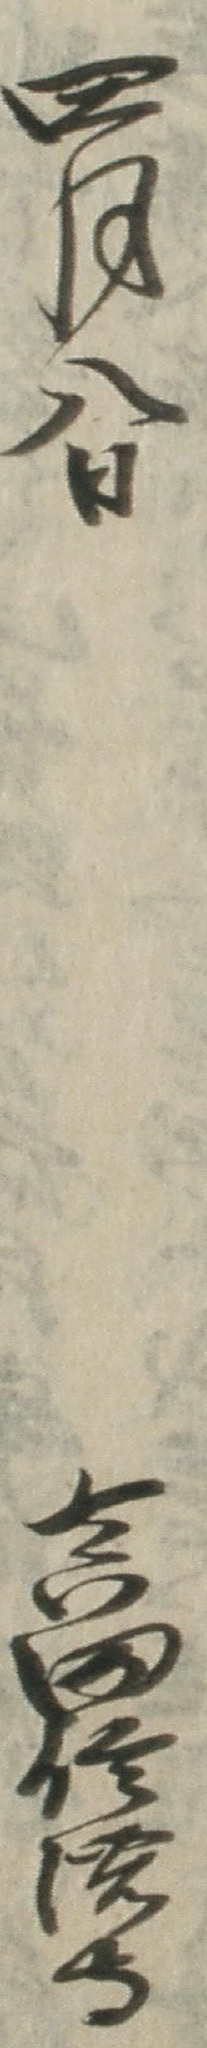四月八日真田信濃守
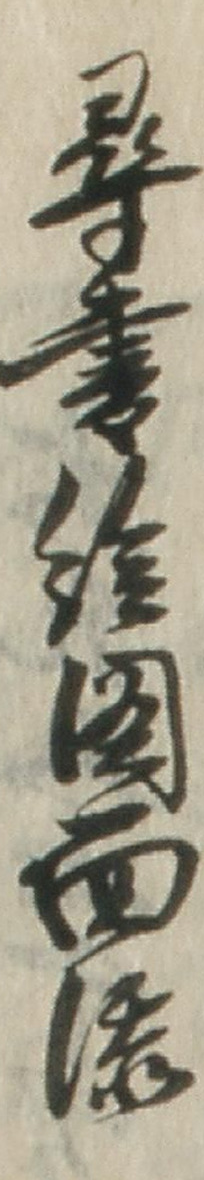尋書絵図面添
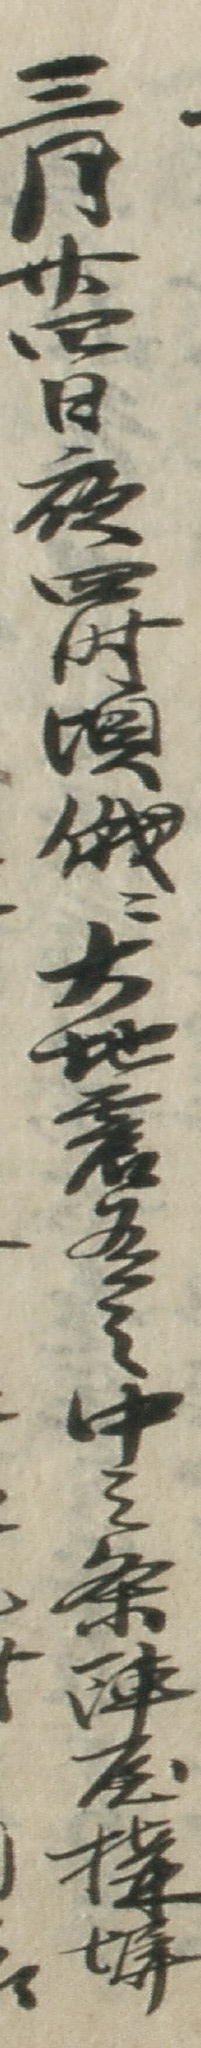三月廿四日夜四時頃俄二大地震有之中之条陣屋構塀
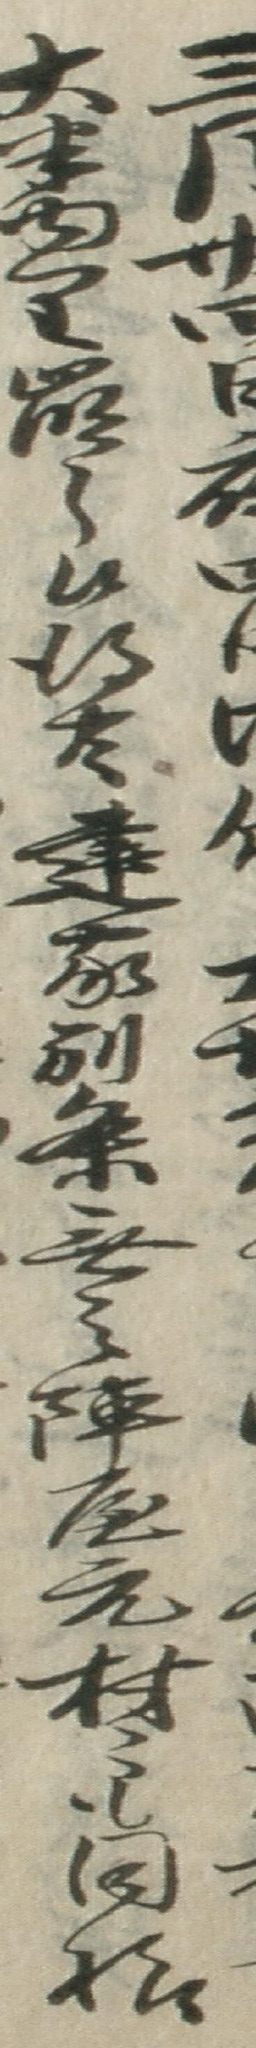大半ゆり崩し候得共建家別条無之陣屋元村二も同様
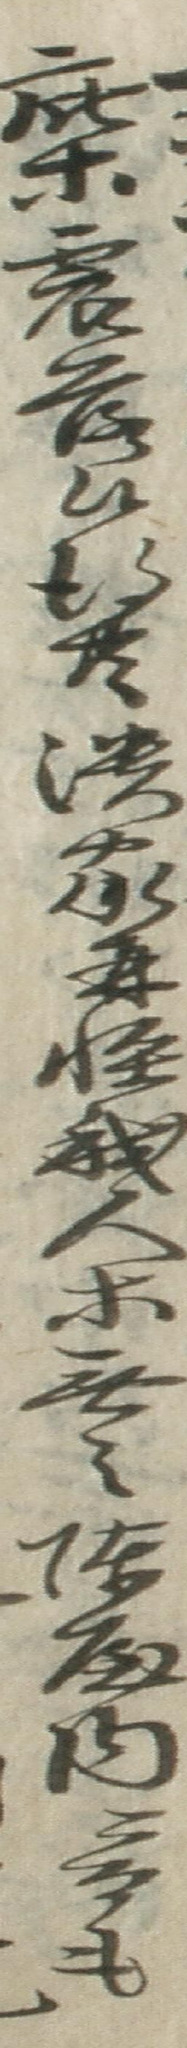庇等震落候得共潰家并怪我人等無之陣屋内二而も
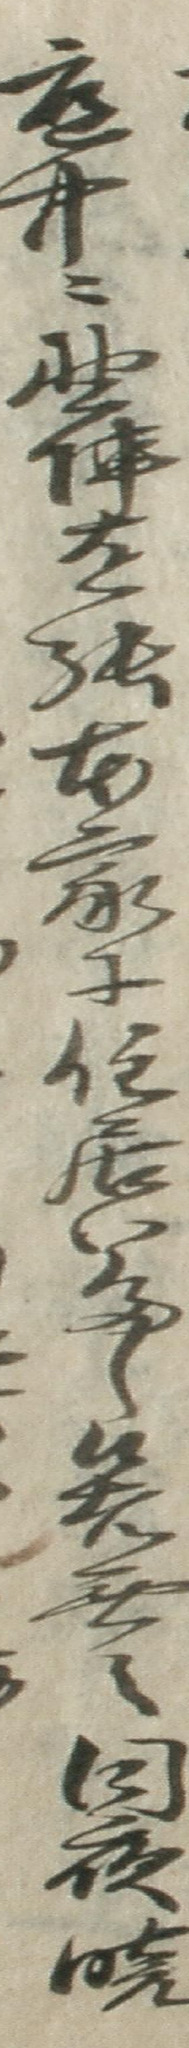庭中二野陣を張本家に住居いたし候者無之同夜暁
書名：信濃國地震實録記
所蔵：東京大学地震研究所図書室 Earthquake Research Institute Library, The University of Tokyo, JAPAN
